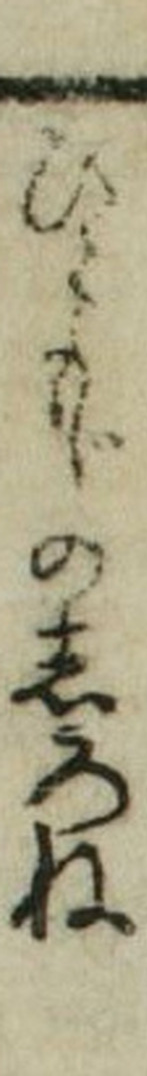ひともじのしろね

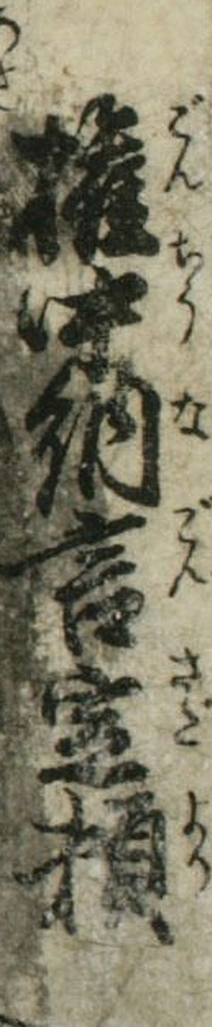権中納言定頼
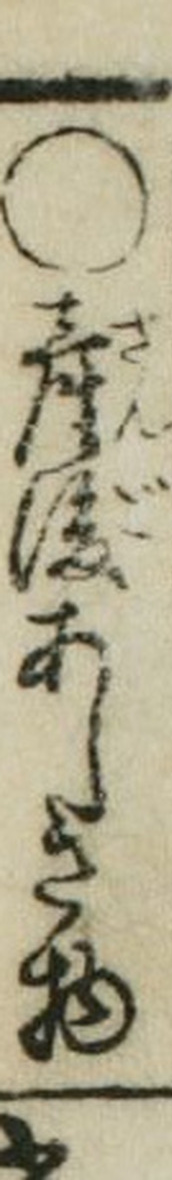○産後あしき物
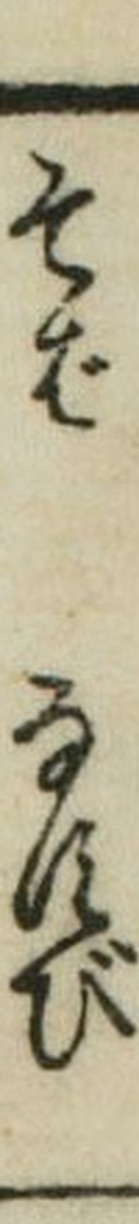そばなすび
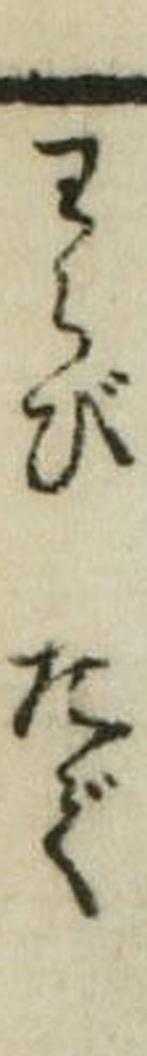わらびたで
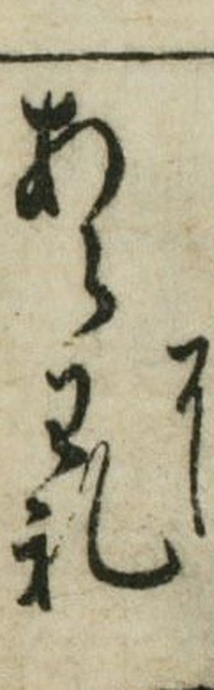あらわれ
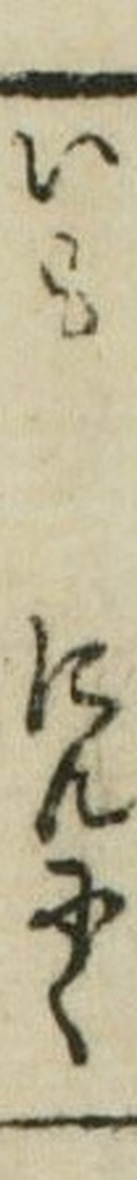いもにんにく
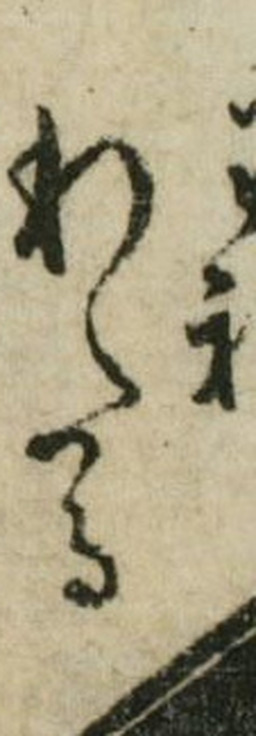わたる
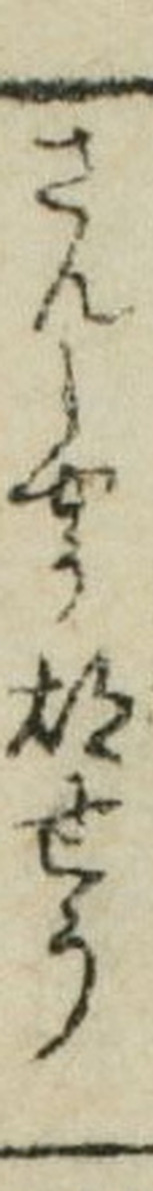さんしやう胡せう
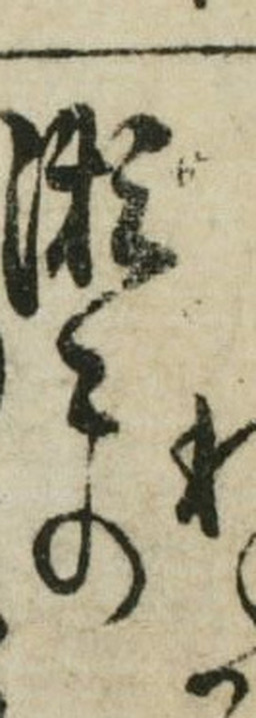瀬々の
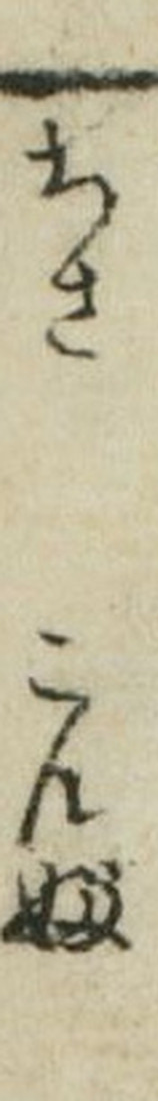ちさこんぶ
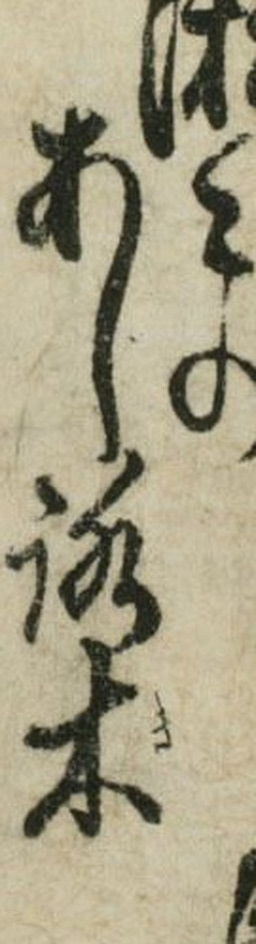あしろ木
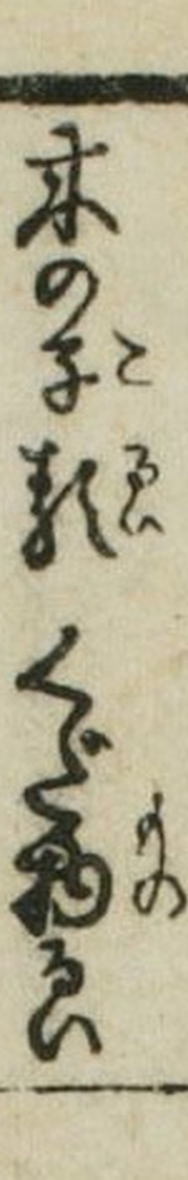木の子類くだ物るい
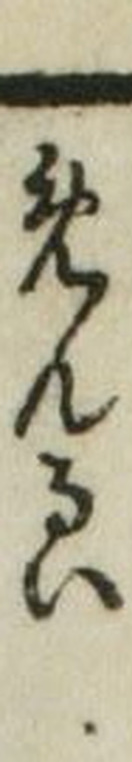めんるい
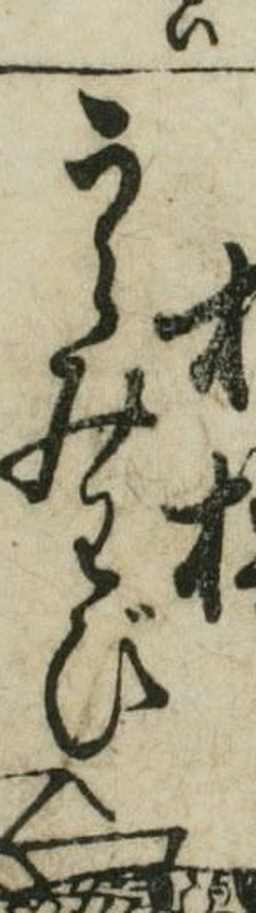うらみわび
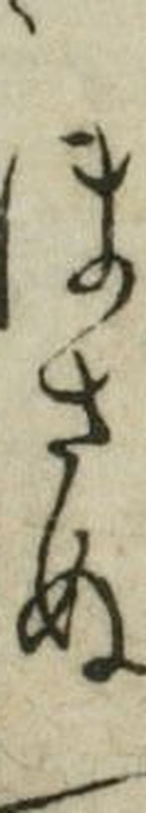ほさぬ
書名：百人一首
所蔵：東京学芸大学教育コンテンツアーカイブ
